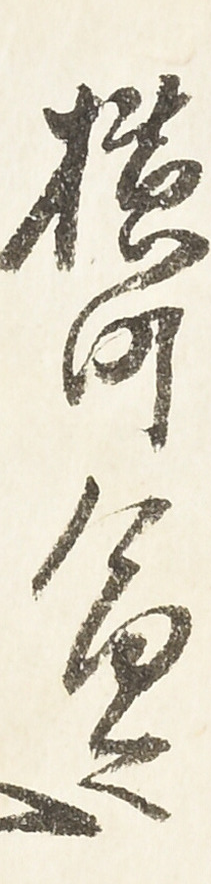横町冨や
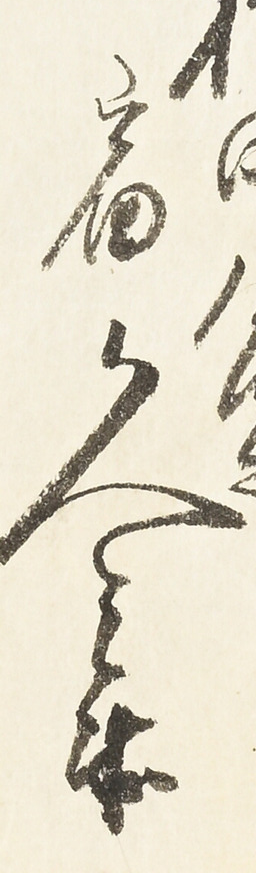宿久兵衛
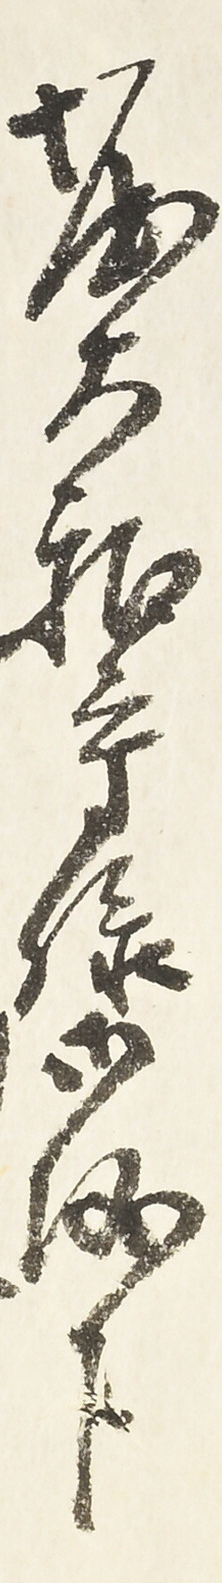堀大和守様御城下
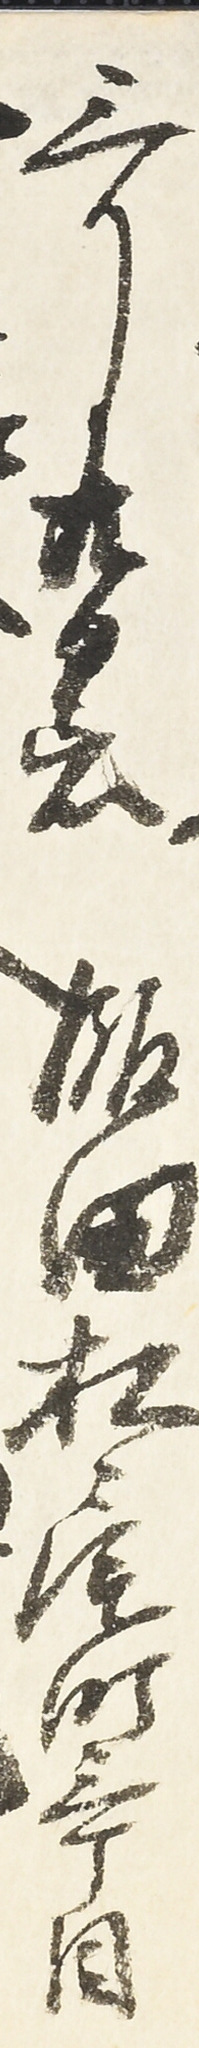三月廿日着飯田松屋町三丁目
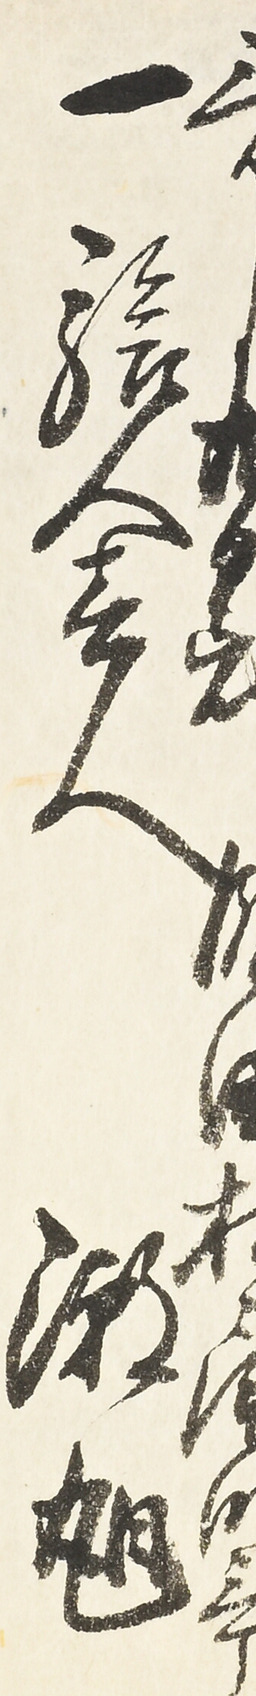一旅人壱人潮旭
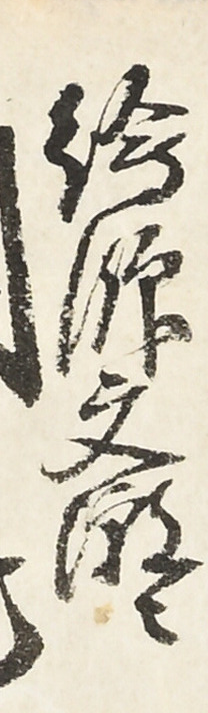絵師文潮ニ
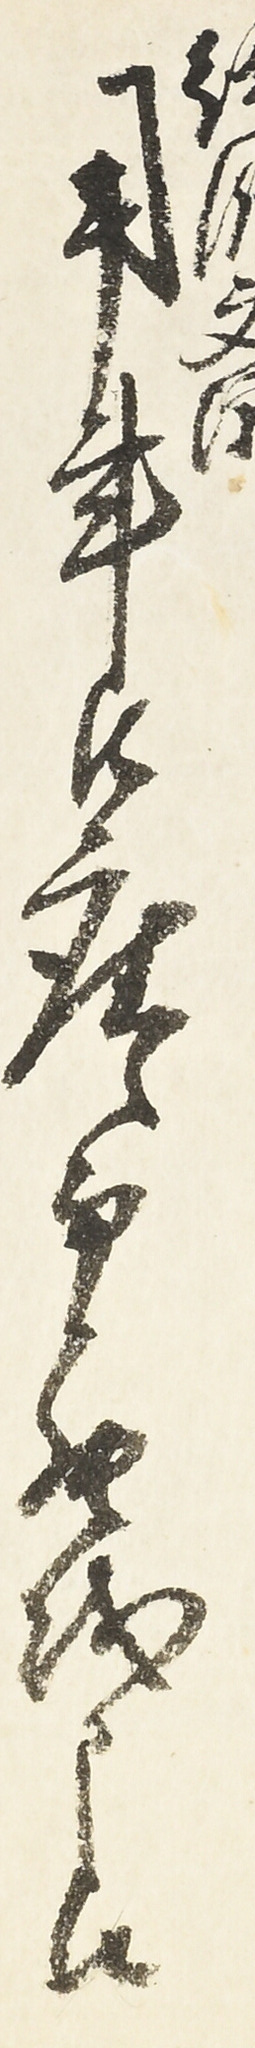用事御座候而罷越申候
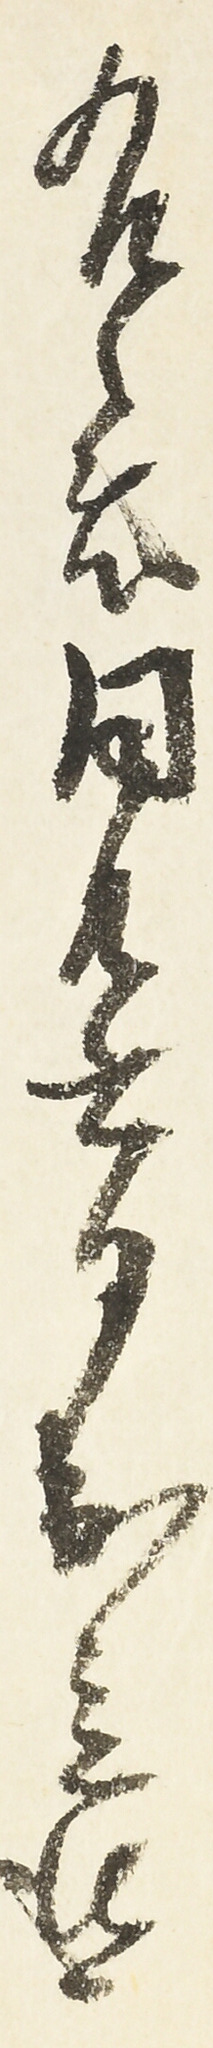右之者同廿六日出立仕候
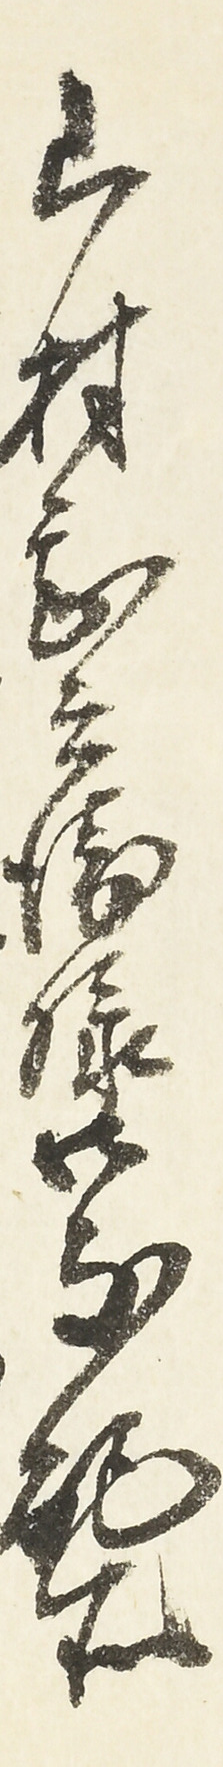山村甚兵衛様御支配所
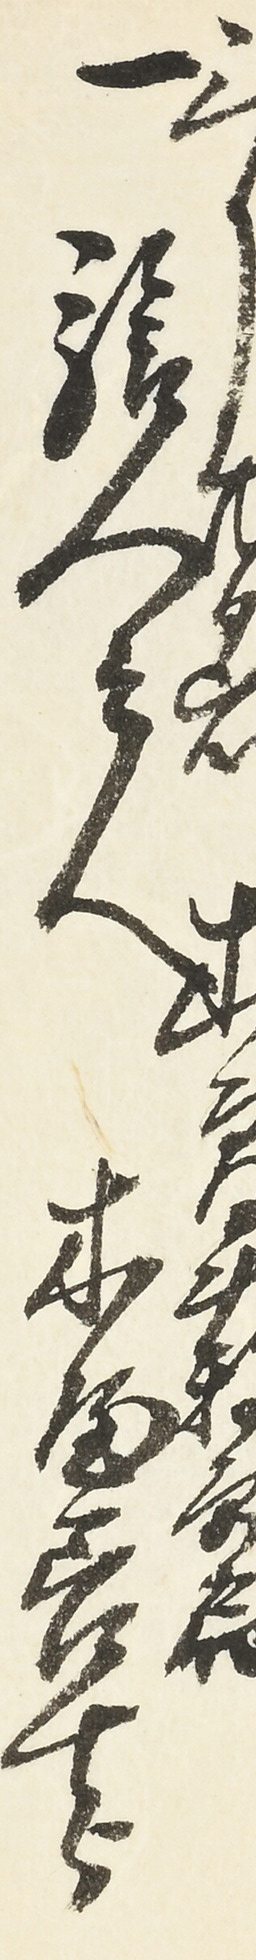一旅人壱人木屋善十郎
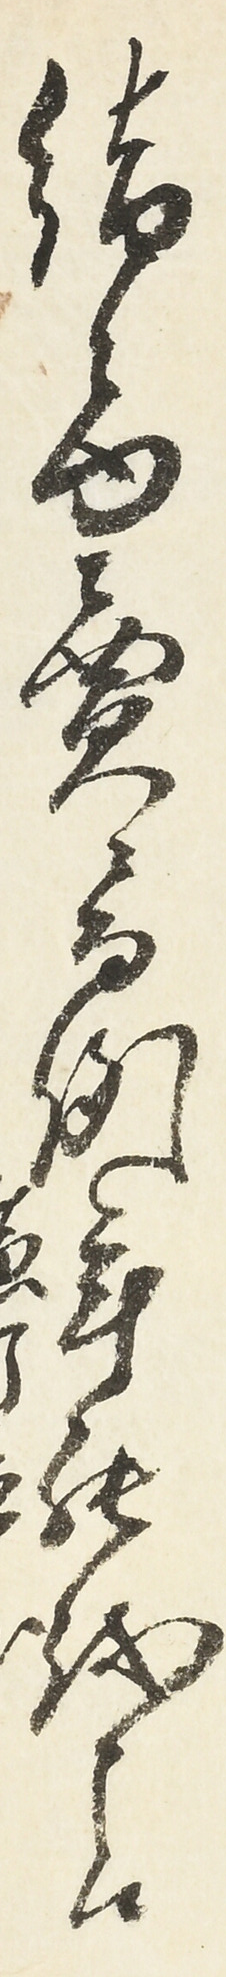絹商売ニ而例年罷越申候
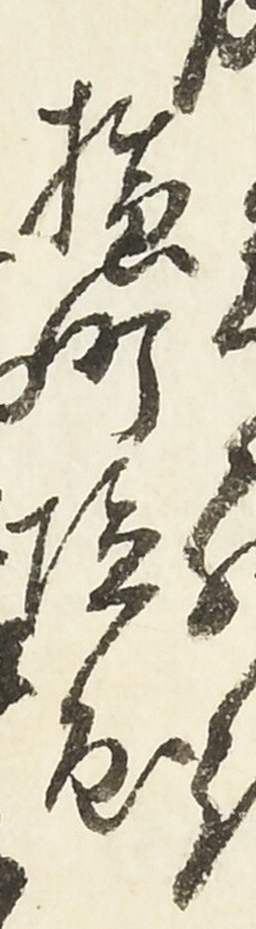横町塩屋
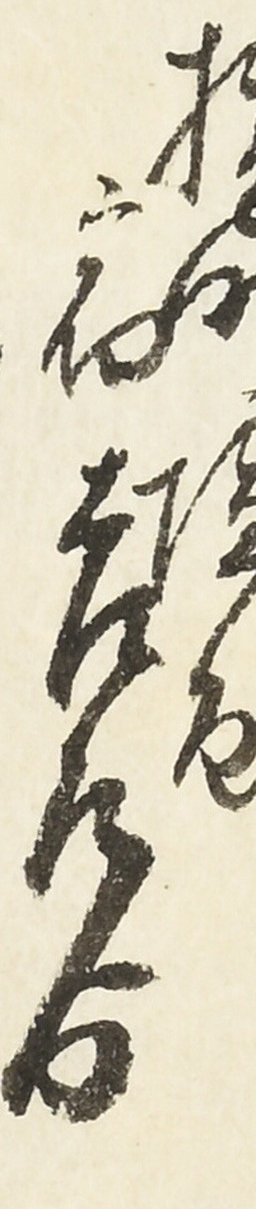宿善左衛門
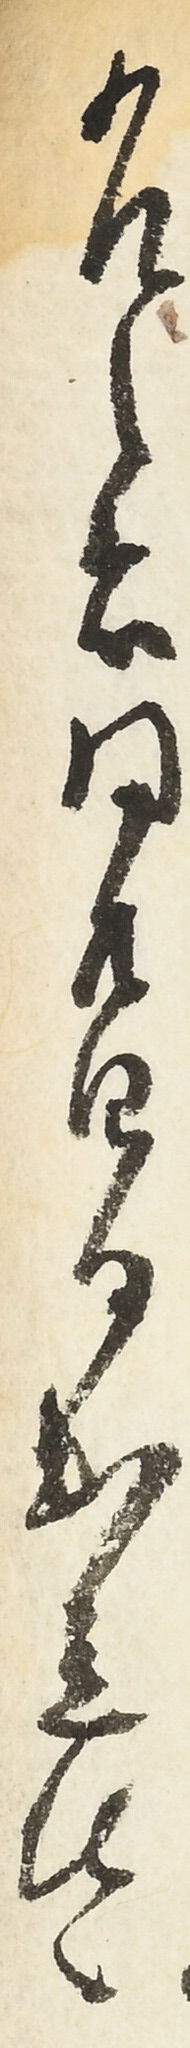右之者同廿四日出立仕候

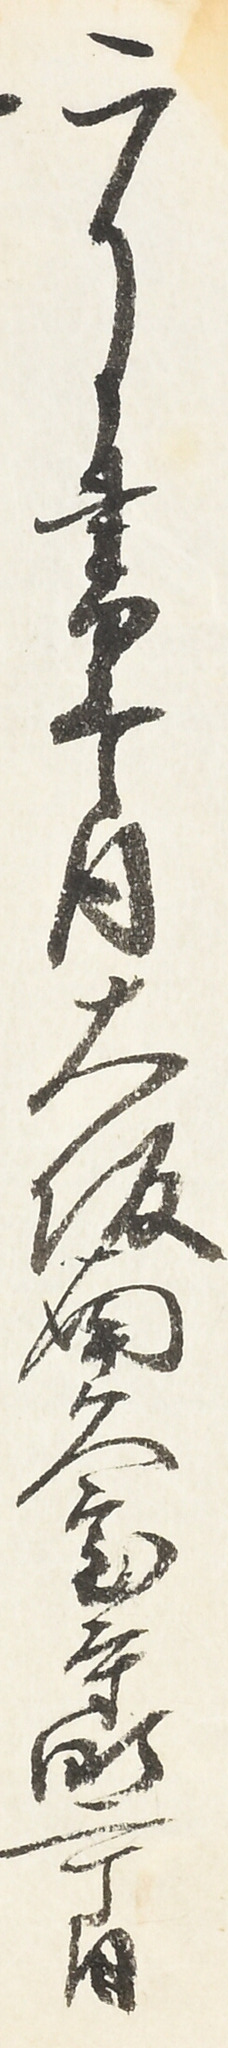二月書上之内大坂南久宝寺町二丁目
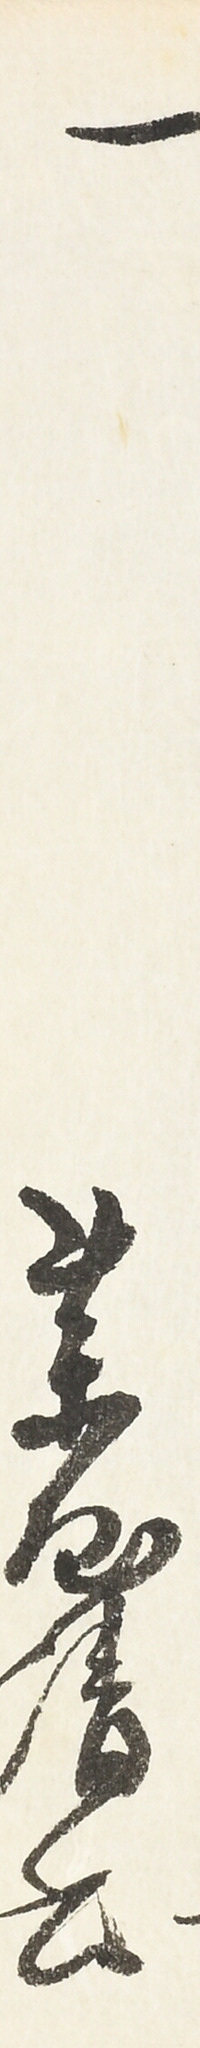一薬屋清六
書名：町中旅人泊控帳
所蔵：伊那市立高遠町図書館・合同会社AMANE
